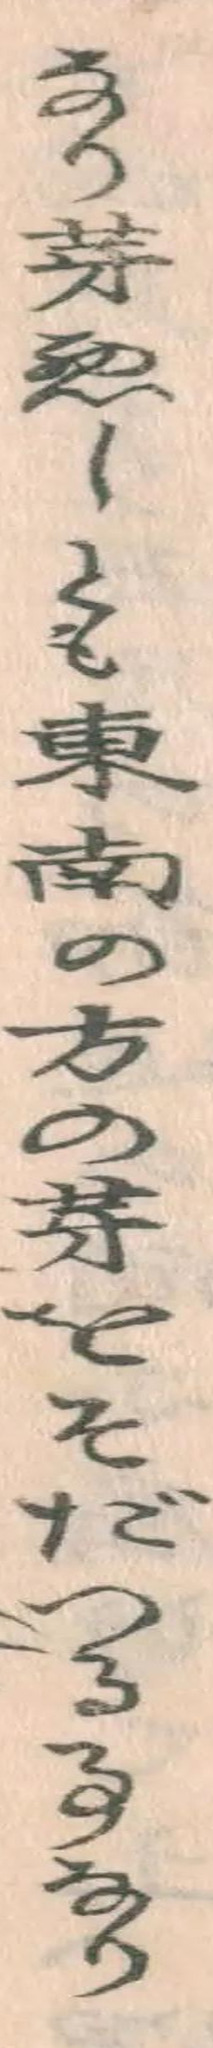なり芽悪しとも東南の方の芽をそだつる事なり
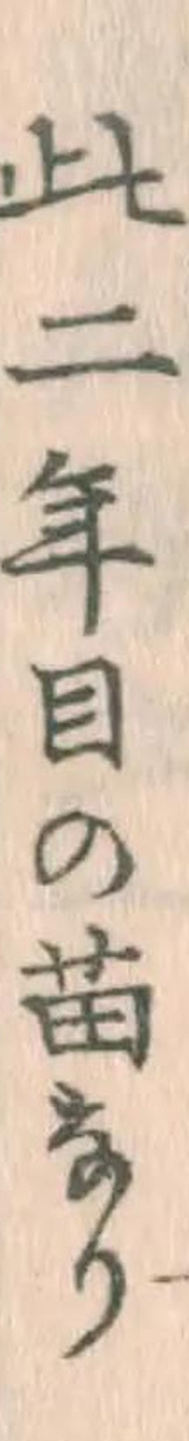此二年目の苗なり
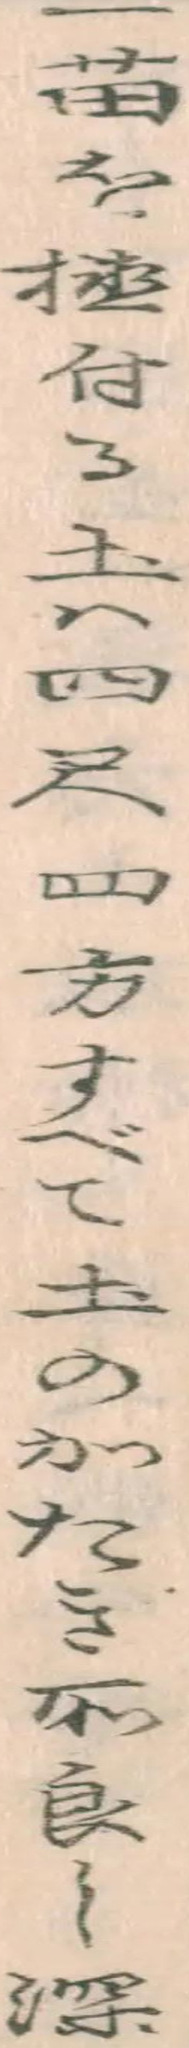一苗を植付る土は四尺四方すべて土のかたき所良し深
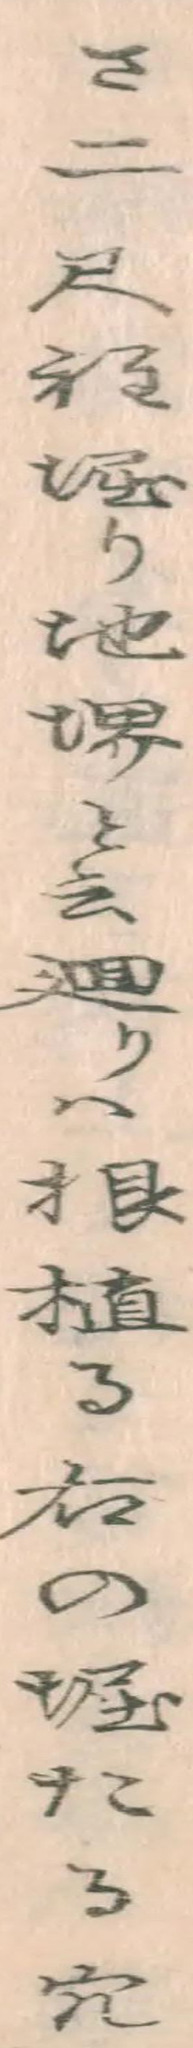さ二尺程掘り地堺と云廻りは根植る右の堀たる穴
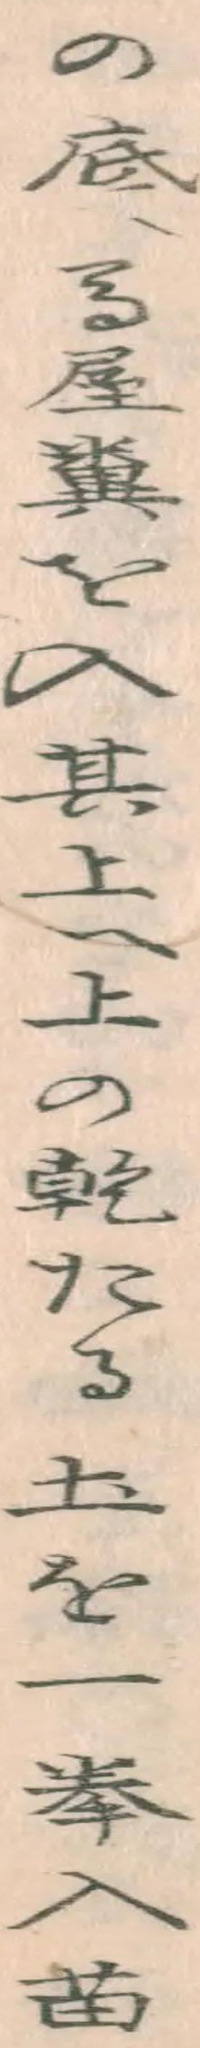の底へ馬屋糞を入其上へ上の乾たる土を一拳入苗
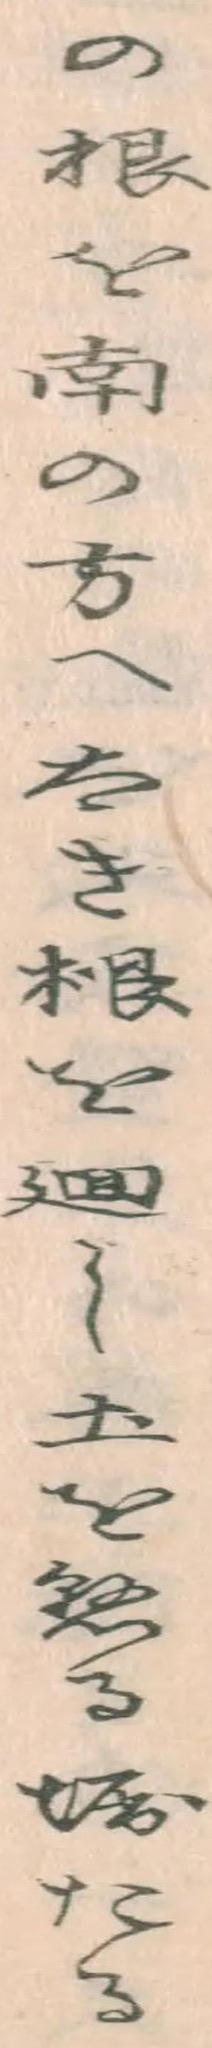の根を南の方へ太き根を廻し土を懸る堀たる
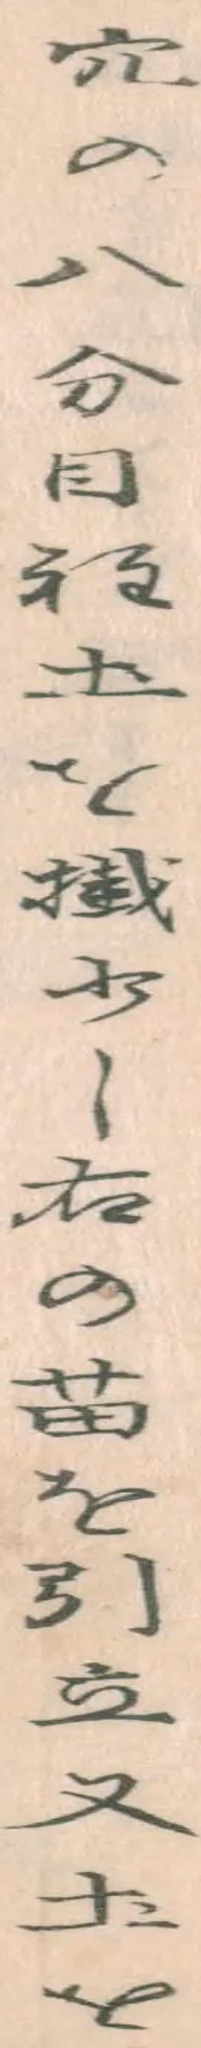穴の八分目程土を掛少し右の苗を引立又土を
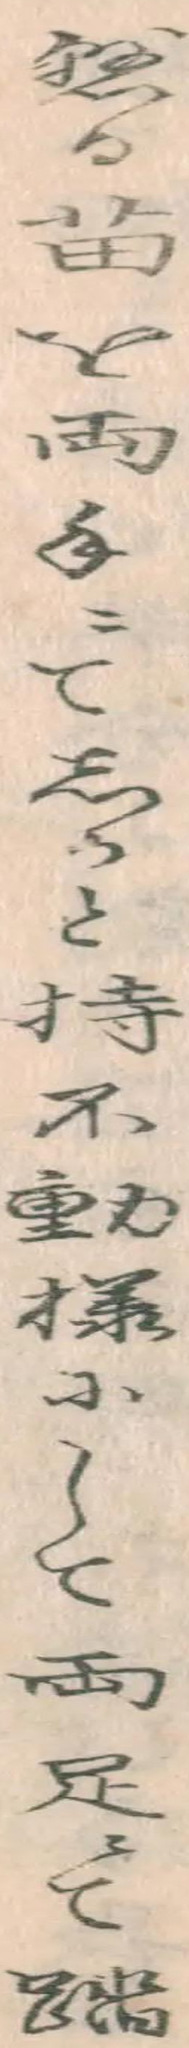懸る苗を両手にてしかと持不動様にして両足にて踏
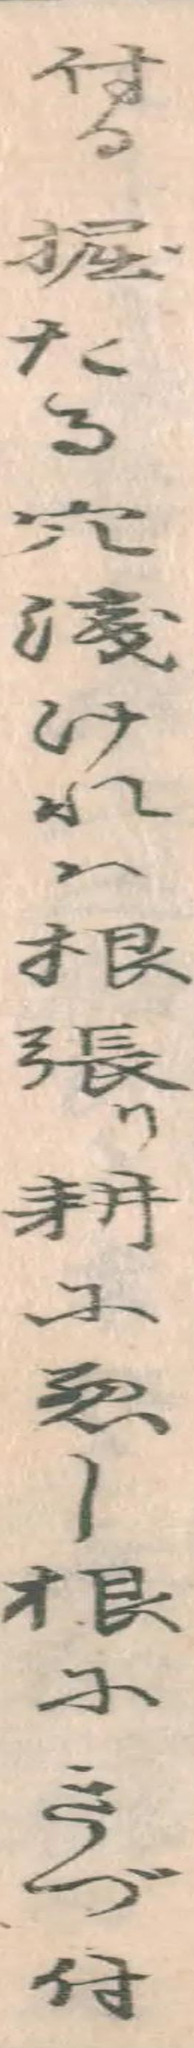付る堀たる穴浅けれは根張り耕に悪し根にきづ付
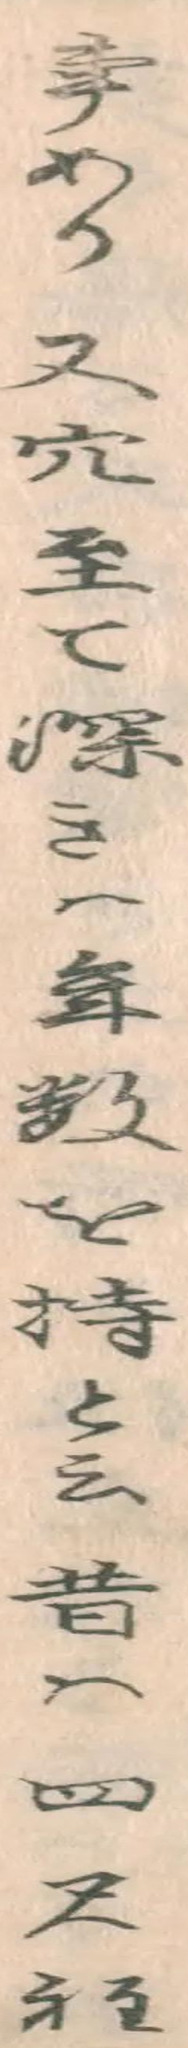事あり又穴至て深きは年数を持と云昔は四尺程
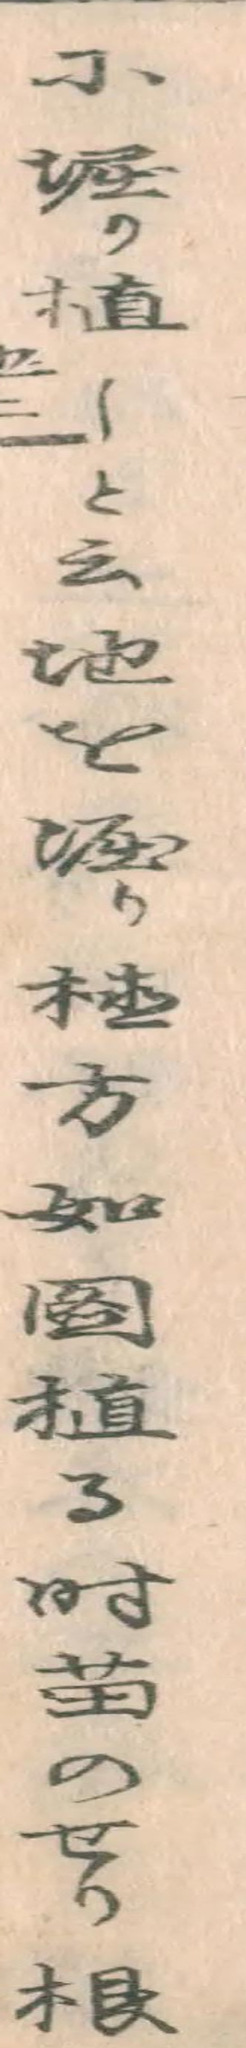に掘り植しと云地を掘り植方如図植る時苗のせり根
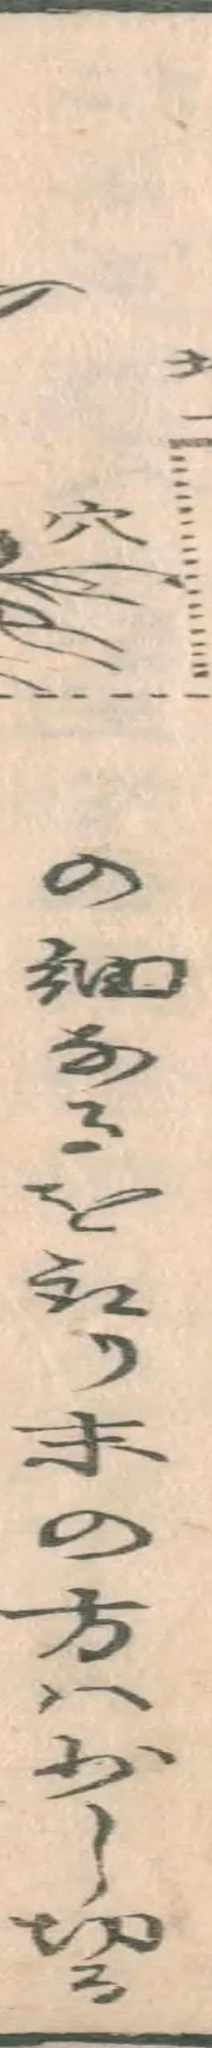の細なるを取り末の方は少し切る
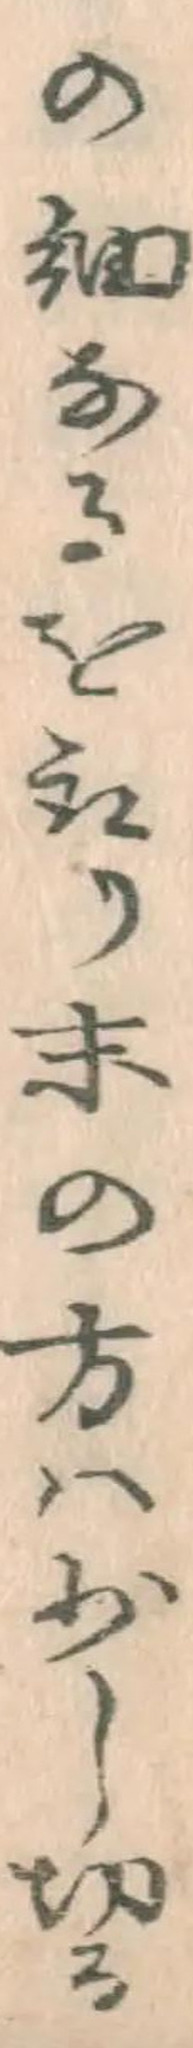の細なるを取り末の方は少し切る
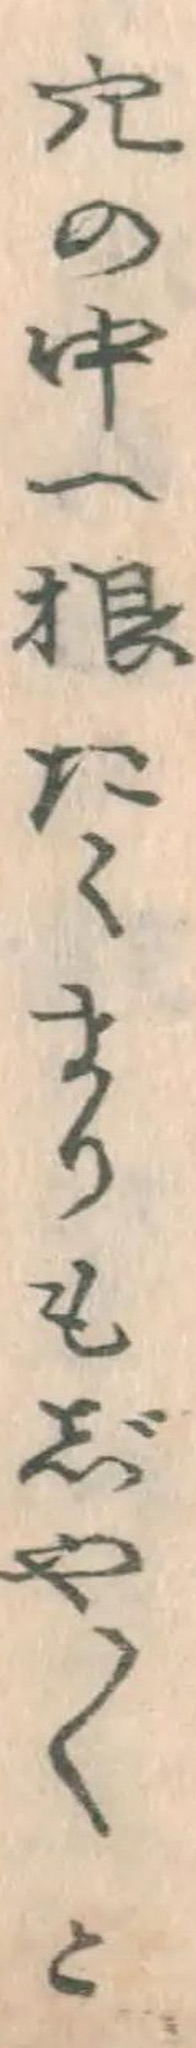穴の中へ根たくまりもじや〳〵と
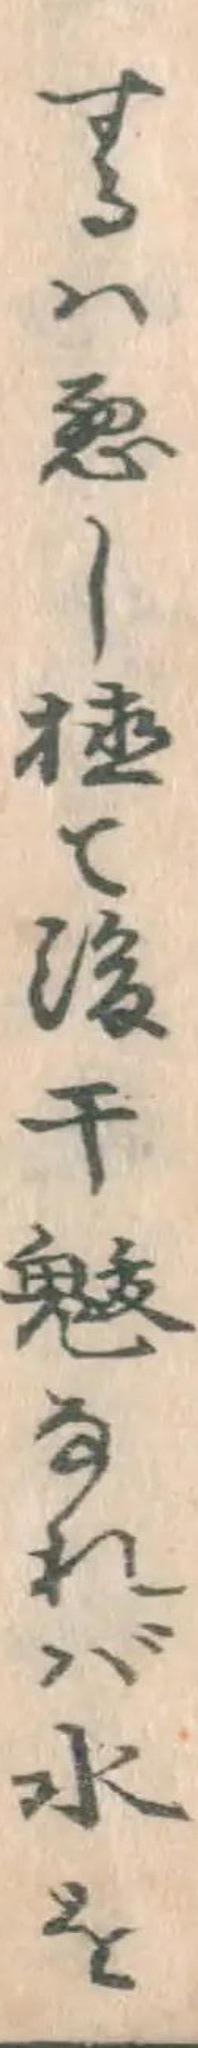するは悪し植て後干魃なれば水を
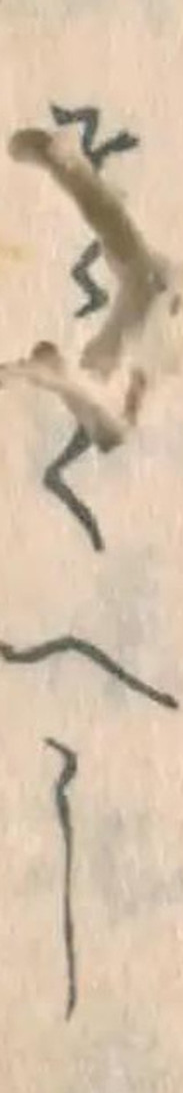そゝくへし
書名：機織彙編 5巻. [1]
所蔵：国立国会図書館 National Diet Library, JAPAN
